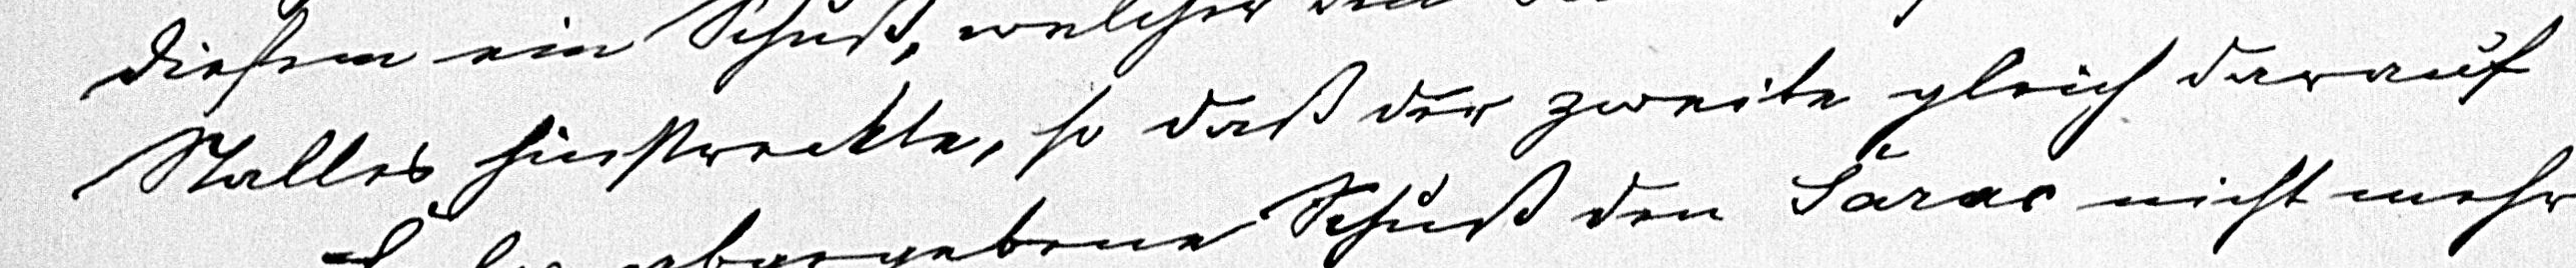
Stalles hinstreckte, so daß der zweite gleich darauf
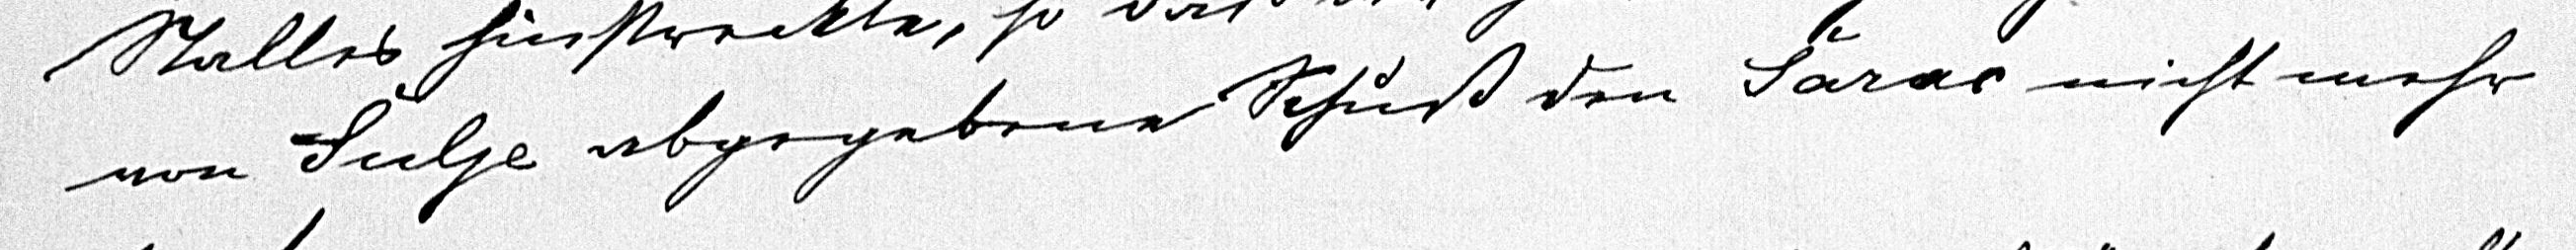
von Šulje abgegebene Schuß den Šarac nicht mehr
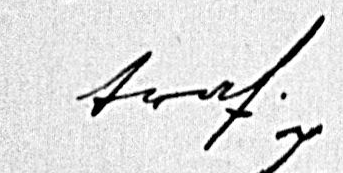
traf.
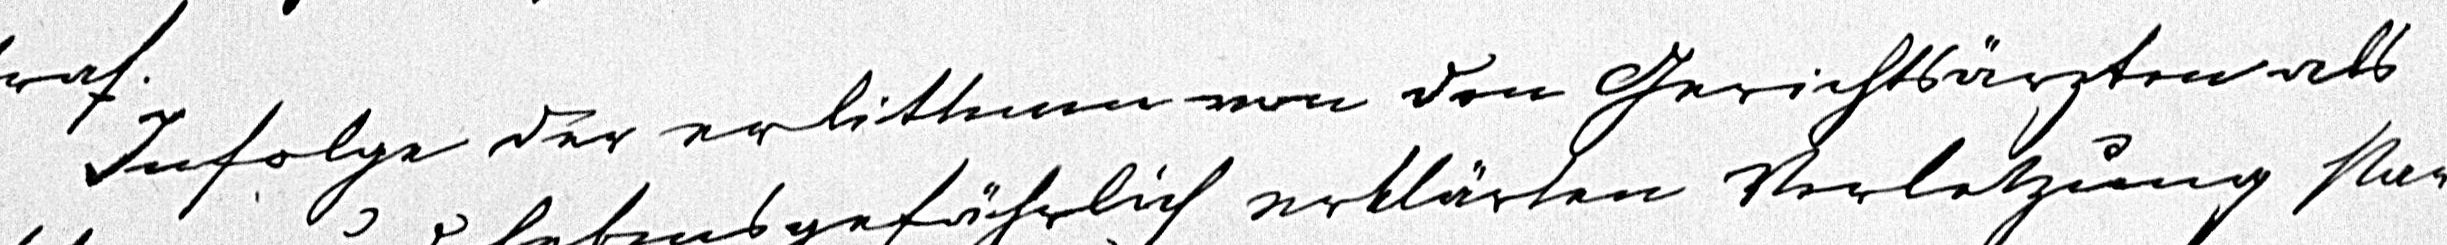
Infolge der erlittenen von den Gerichtsärzten als
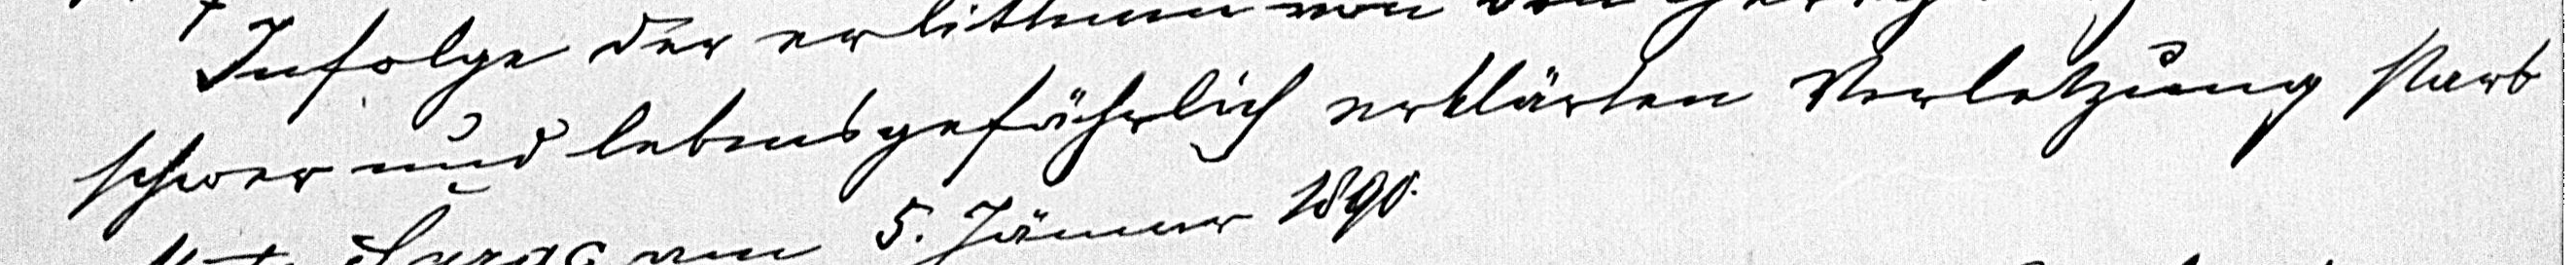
schwer und lebensgefährlich erklärten Verletzung starb
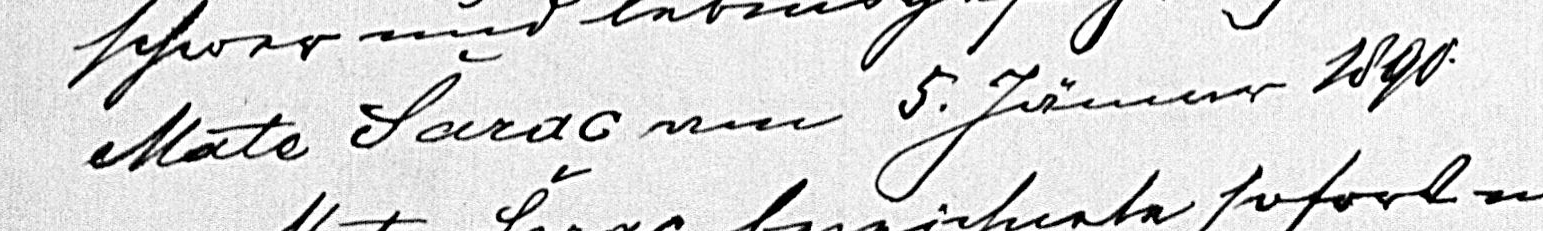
Mate Šarac am 5. Jänner 1890.
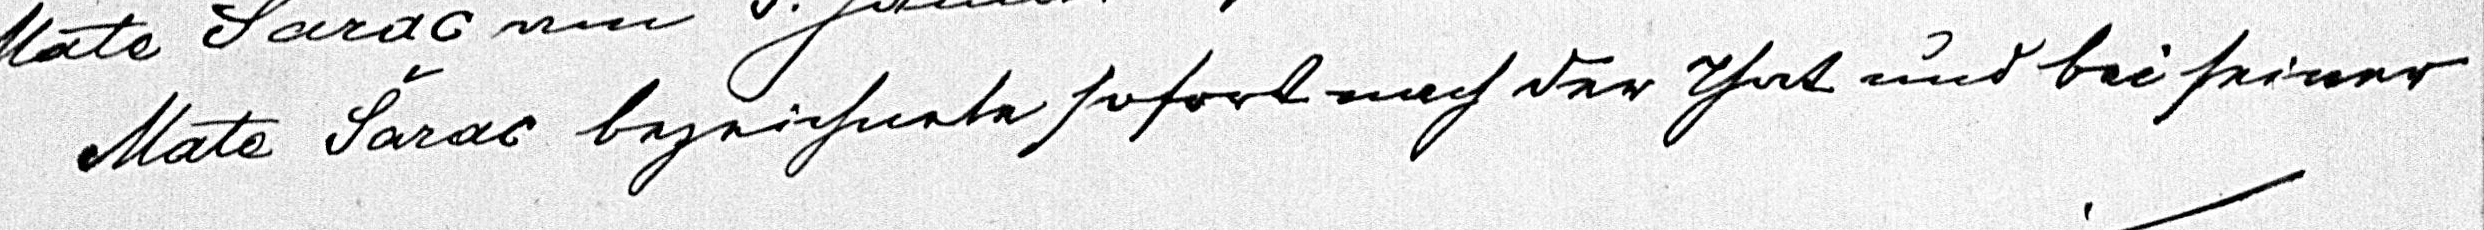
Mate Šarac bezeichnete sofort nach der That und bei seiner
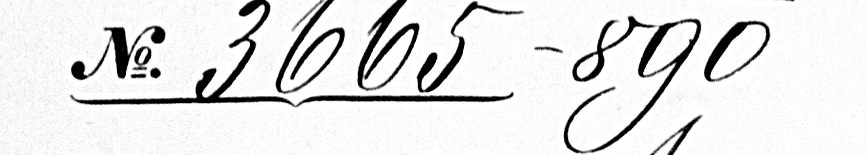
N° 3665-890
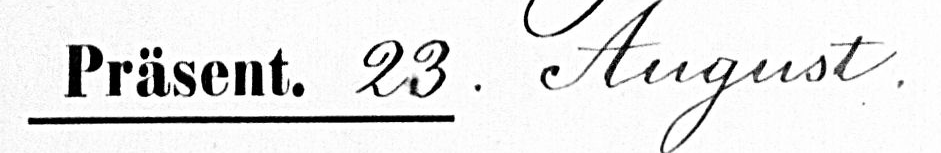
Präsent 23. August.
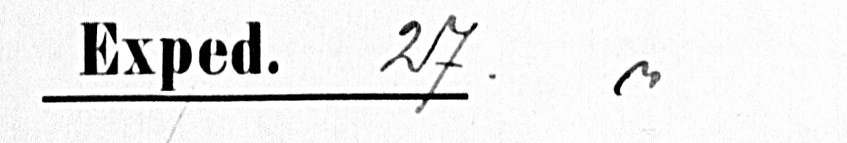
Exped. 27. August.
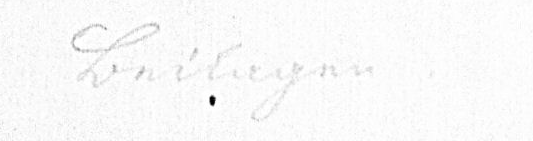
Beilagen
